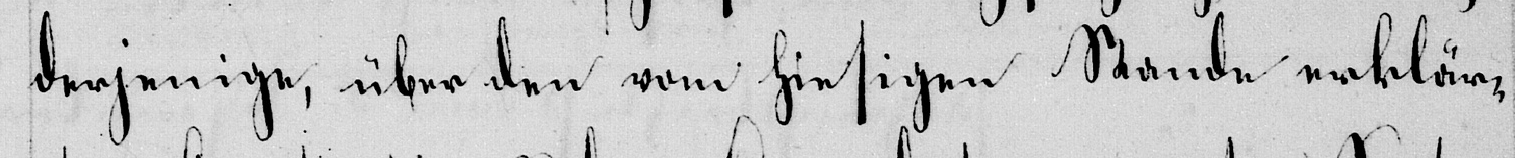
derjenige, über den vom hiesigen Stande erklär¬
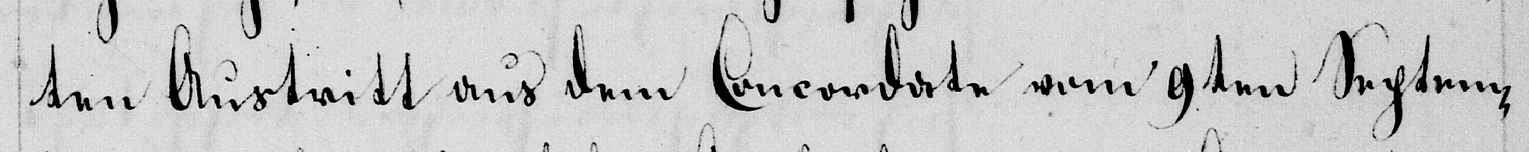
ten Austritt aus dem Concordate vom 9ten Septem¬
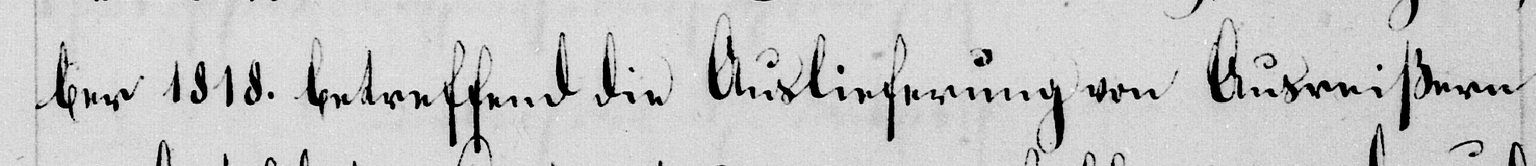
ber 1818. betreffend die Auslieferung von Ausreißern
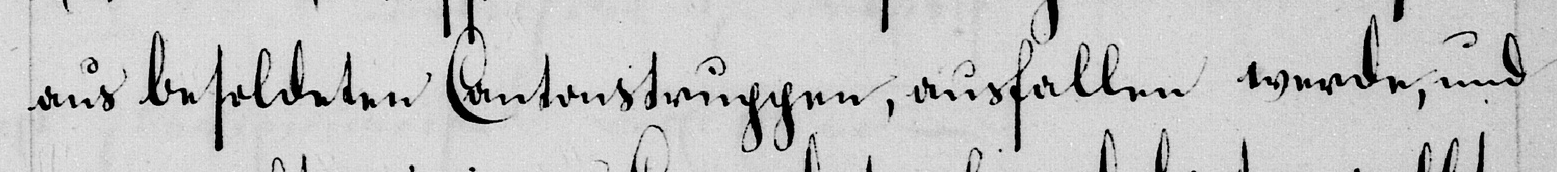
aus besoldeten Cantonstruppen, ausfallen werde, und
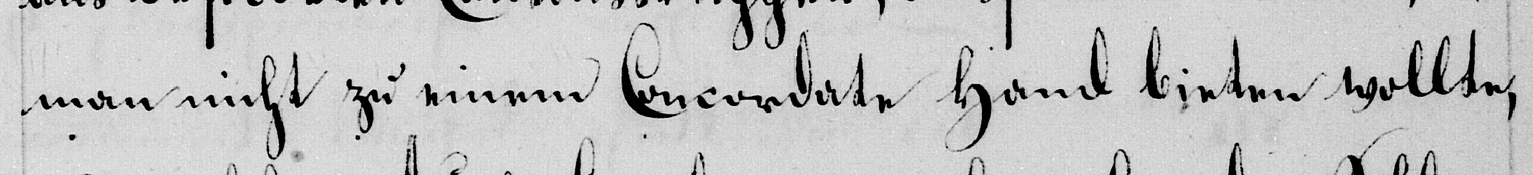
man nicht zu einem Concordate Hand bieten wollte,
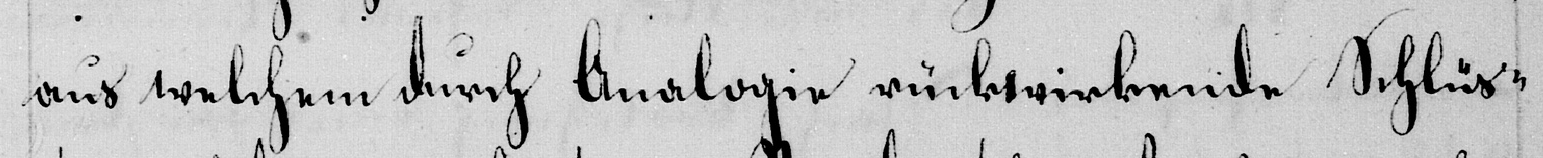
aus welchem durch Analogie rückwirkende Schlüß¬
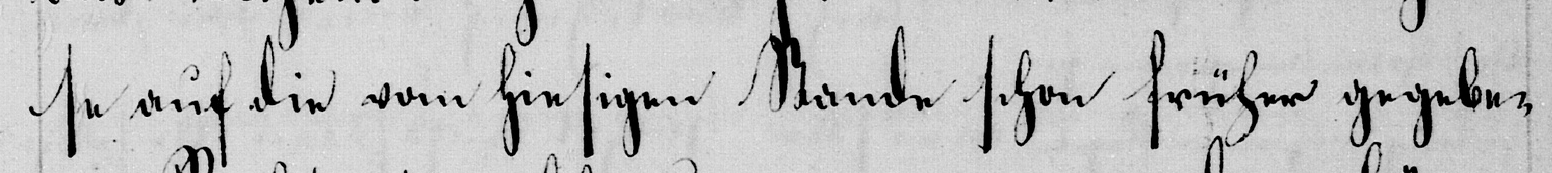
e auf die vom hiesigen Stande schon früher gegebe¬
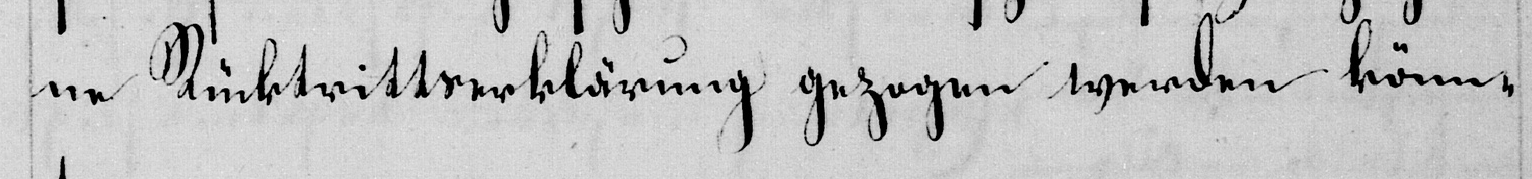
ne Rücktrittserklärung gezogen werden könn¬
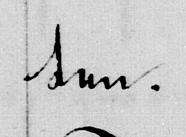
ten.
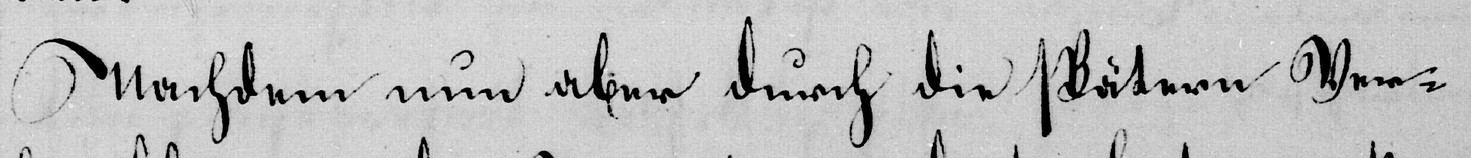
Nachdem nun aber durch die späteren Ver¬
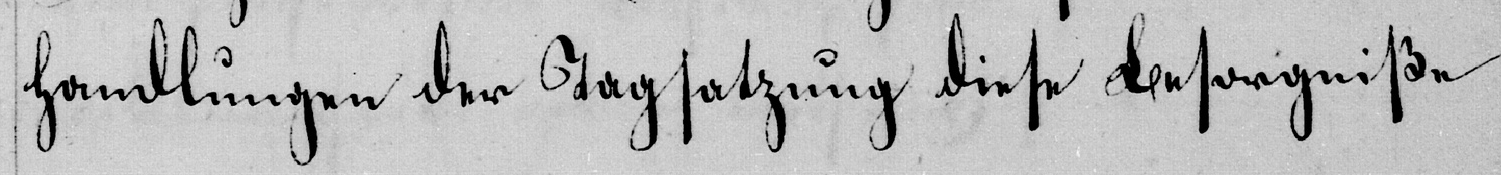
handlungen der Tagsatzung diese Besorgniße
